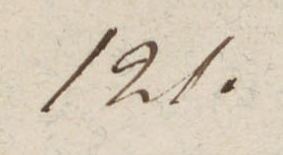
121.
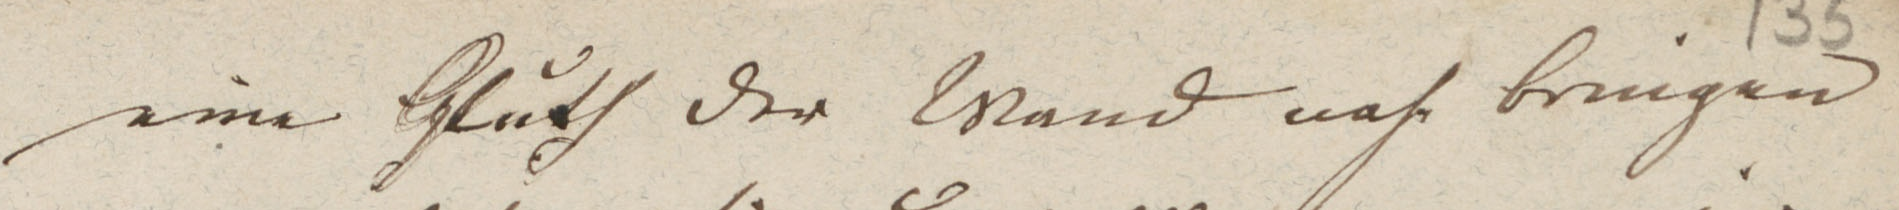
eine Gluth der Wand nahe bringen
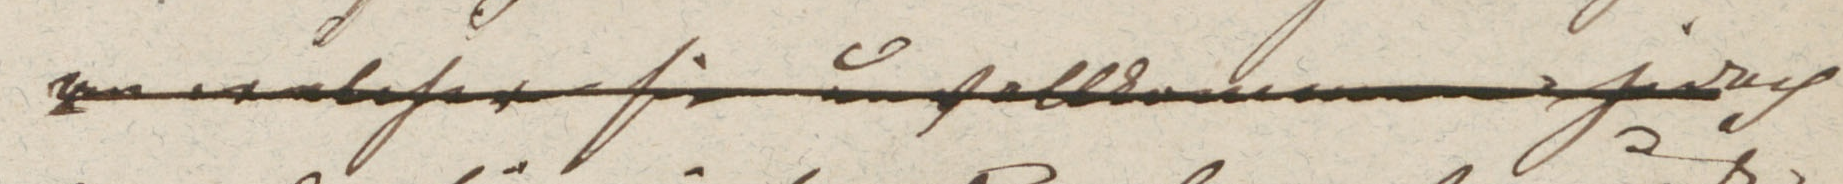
an welcher sie unvollkommen jedoch
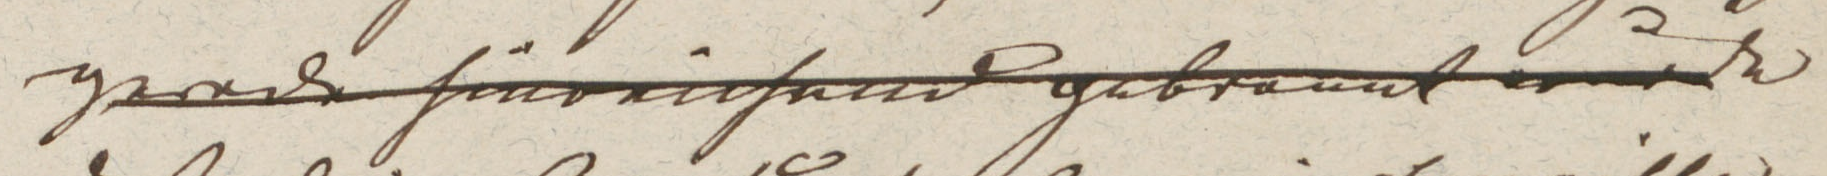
gerade hinreichend gebrannt wurde
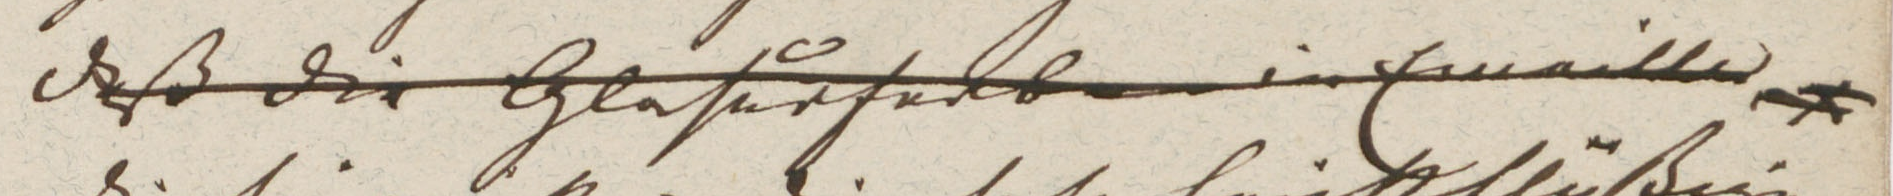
dass die Glasurfarben in Emaille %
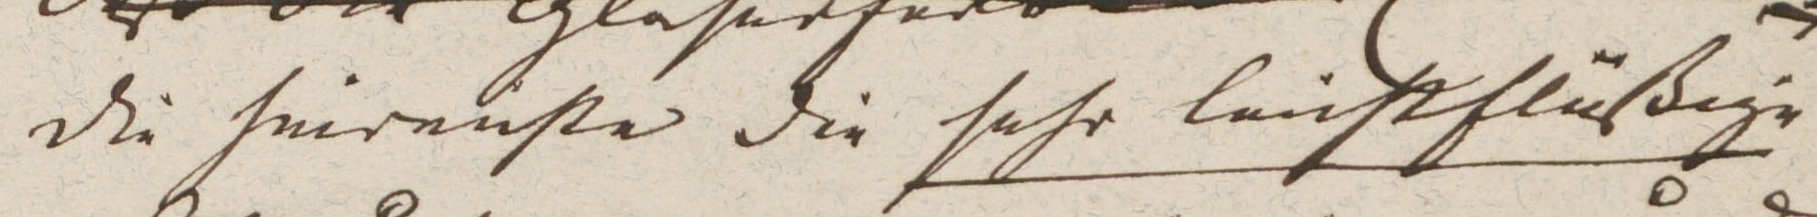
die hinreichte die sehr leichtflüssige
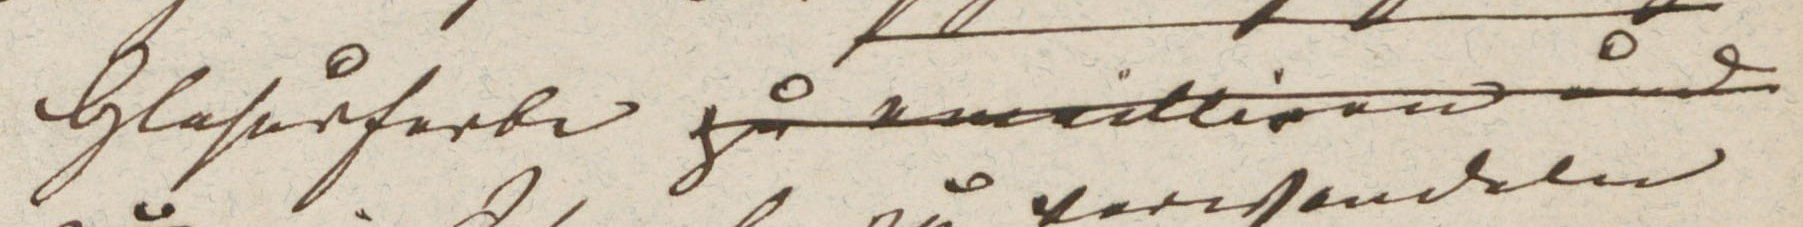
Glasurfarbe zu emailliren und
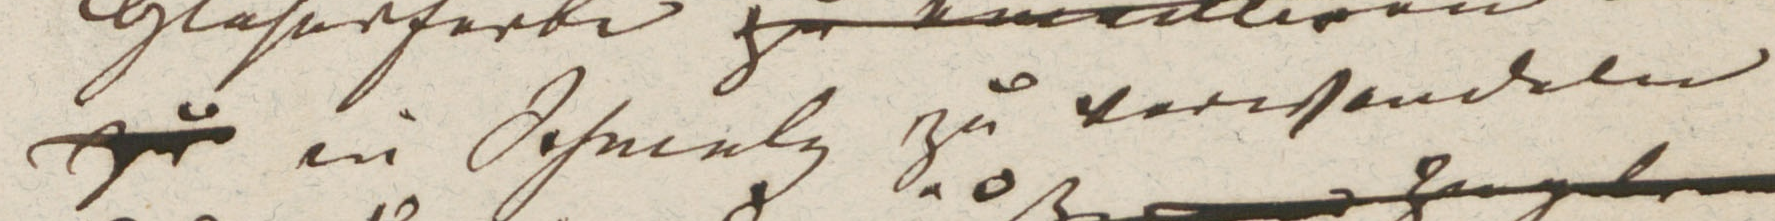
zu in Schmelz zu verwandeln
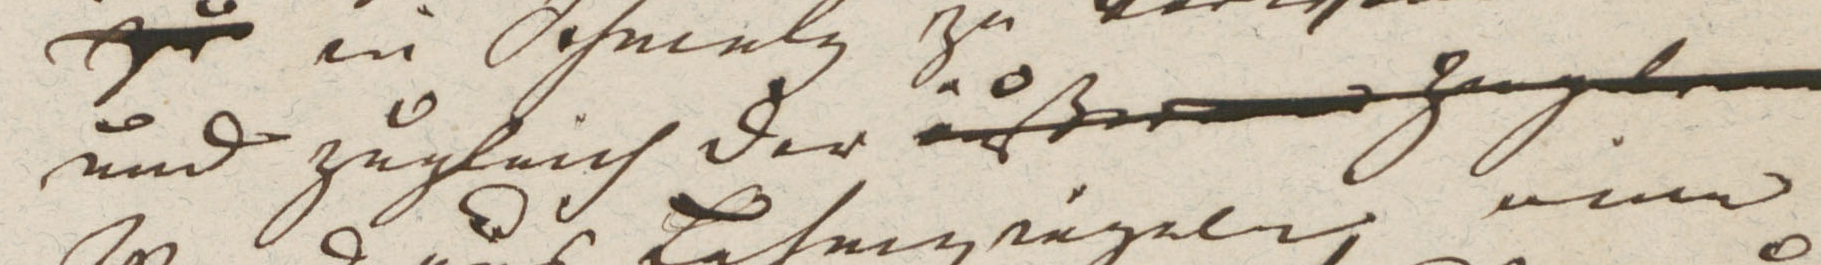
und zugleich der äusseren Ziegelwand
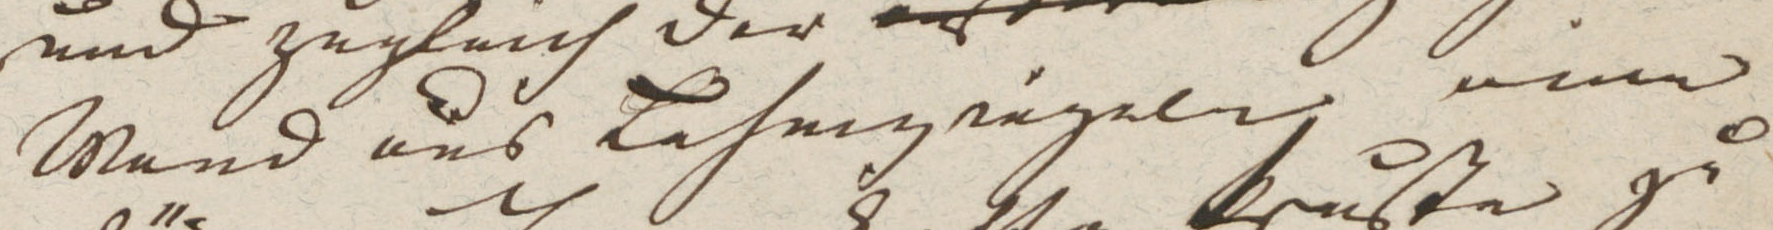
Wand aus Lehmziegeln eine
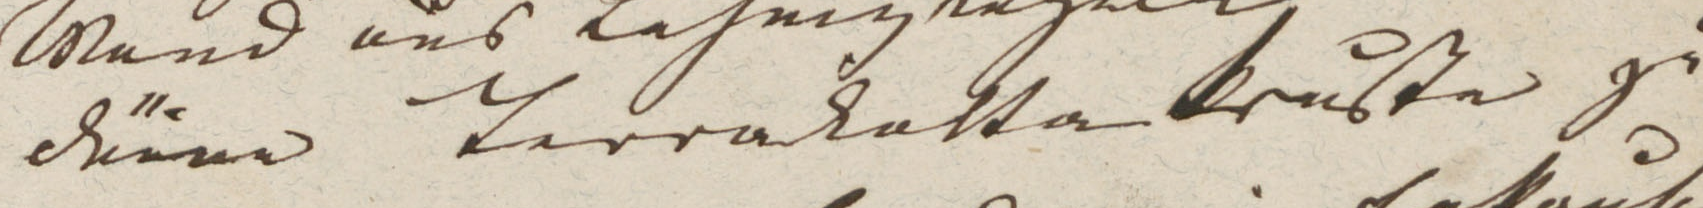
dünne Terrakottakruste zu
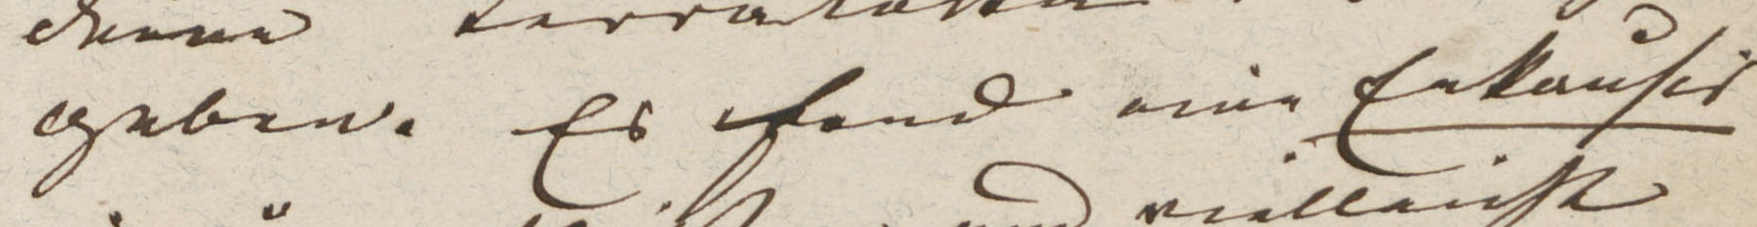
geben. Es fand eine Enkausis
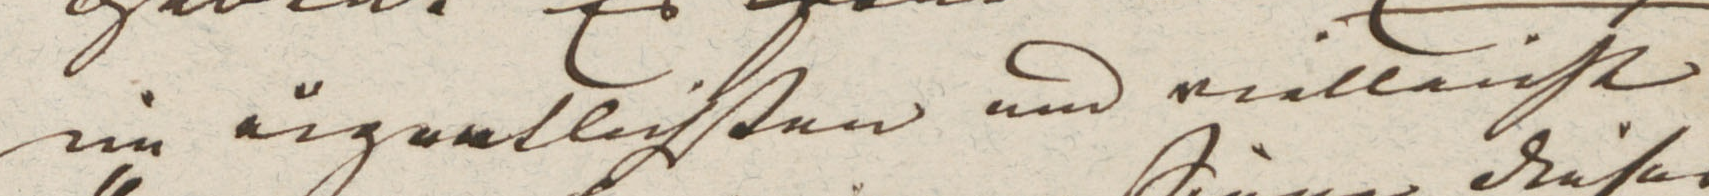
im eigentlichsten und vielleicht
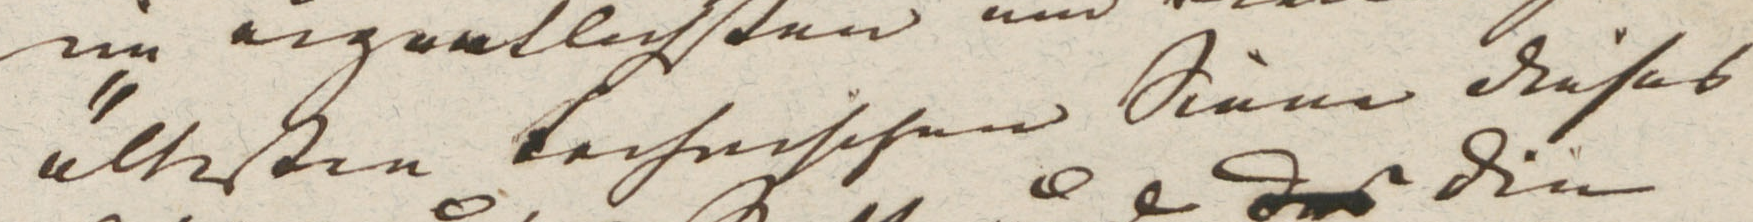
ältesten technischen Sinne dieses
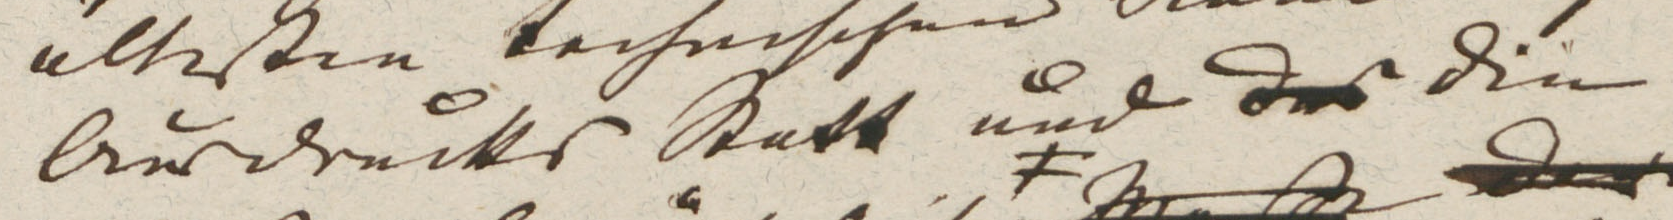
Ausdruckes Statt und das die
